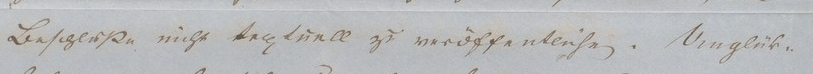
Beschlüße nicht textuell zu veröffentlichen. Unglük-
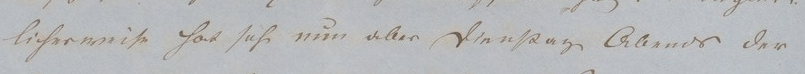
licherweise hat sich nun aber Dienstag Abends der
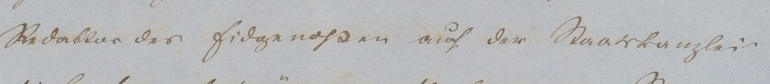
Redaktor des Eidgenoßen auf der Staatskanzlei
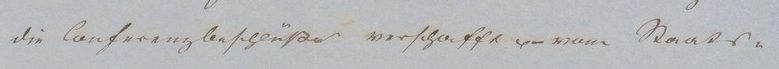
die Conferenzbeschlüße verschafft &– vom Staats-
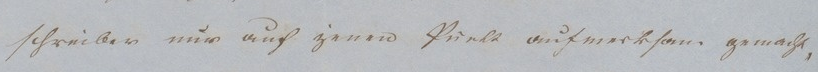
schreiber nur auf jenen Punkt aufmerksam gemacht,
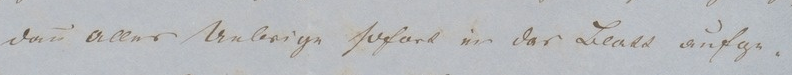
dann alles Uebrige sofort in das Blatt aufge-
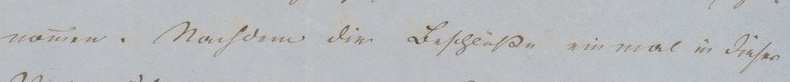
nommen. Nachdem die Beschlüße einmal in dieser
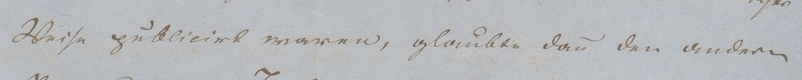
Weise publicirt waren, glaubte dann den andern
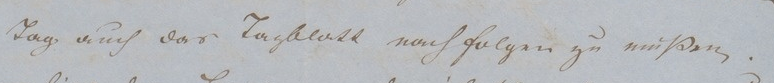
Tag auch das Tagblatt nachfolgen zu müßen.
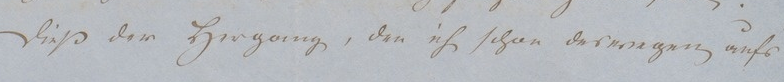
Dieß der Hergang, den ich schon deswegen auf's
